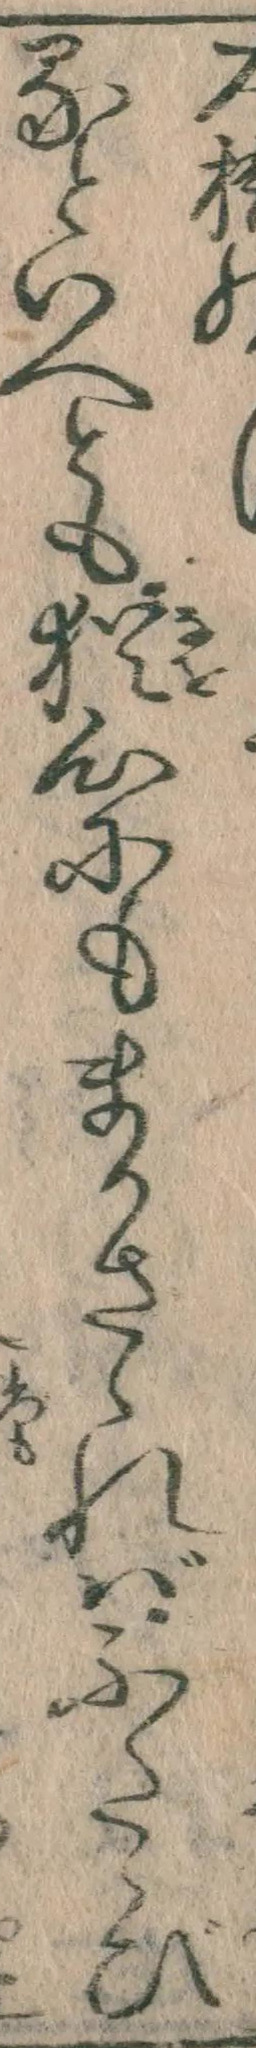るといへとも、猶心にもまかさゝれば、ふたゝび
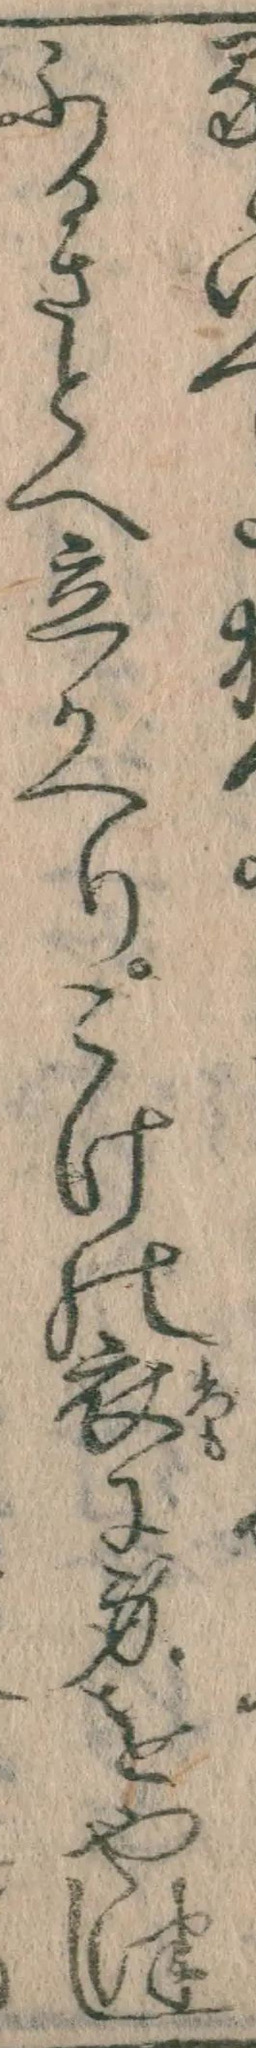ふるさとへ立かへり。こけの衣に身をやつし
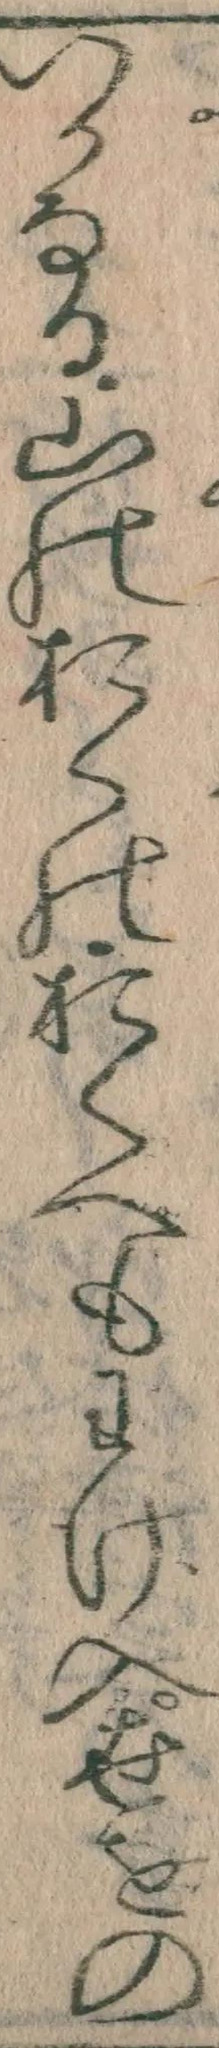いかなる、山のおくの、おくへもわけ入。世をの
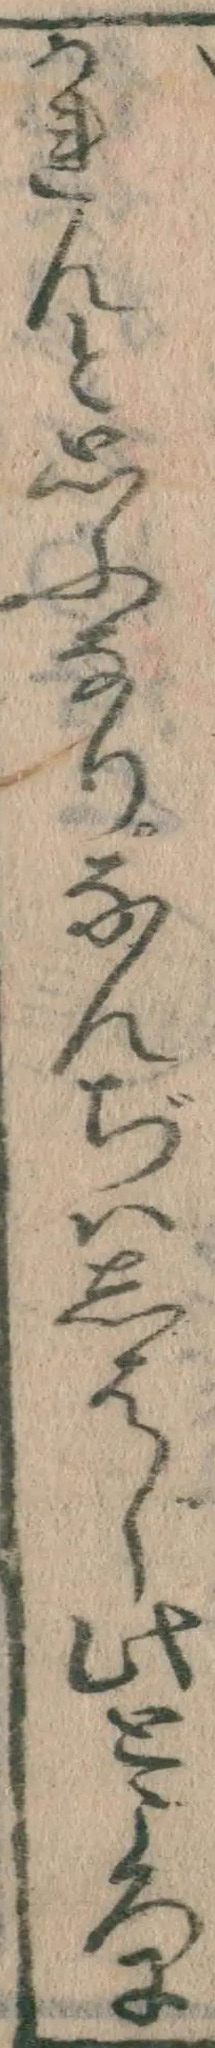かれんと思ふなり。なんぢはしはし此ところに
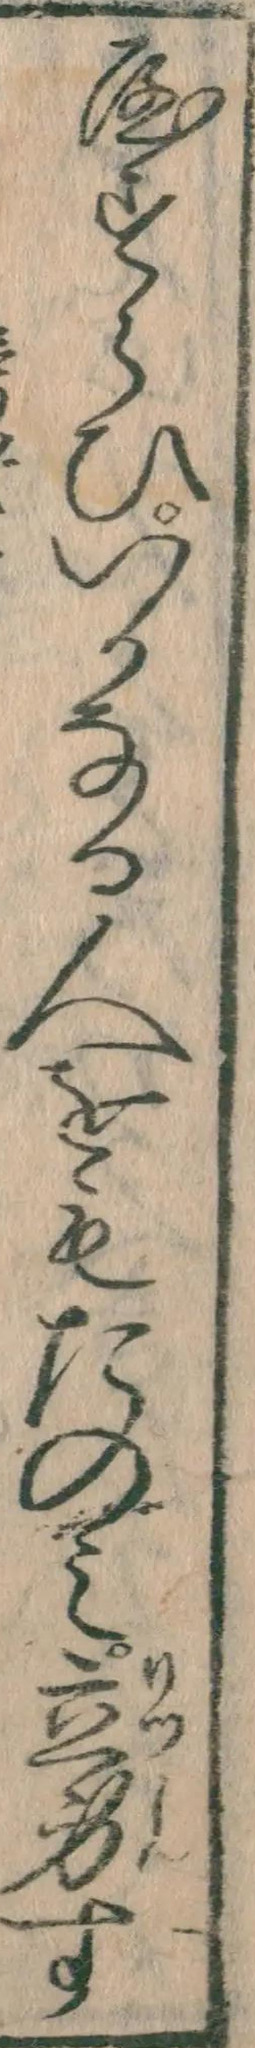やすらひ。いかなる人をもたのみ。立身す
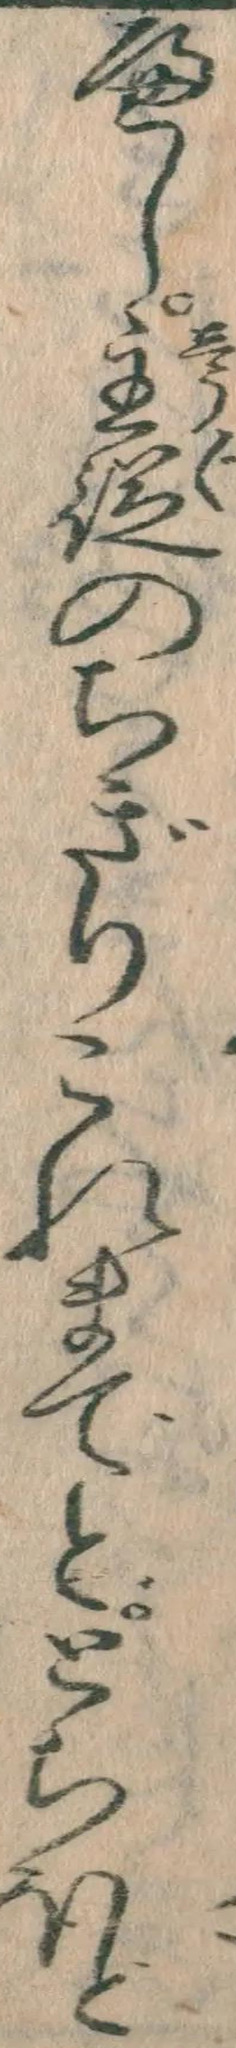へし。主従のちぎりこれまでと。とちほと
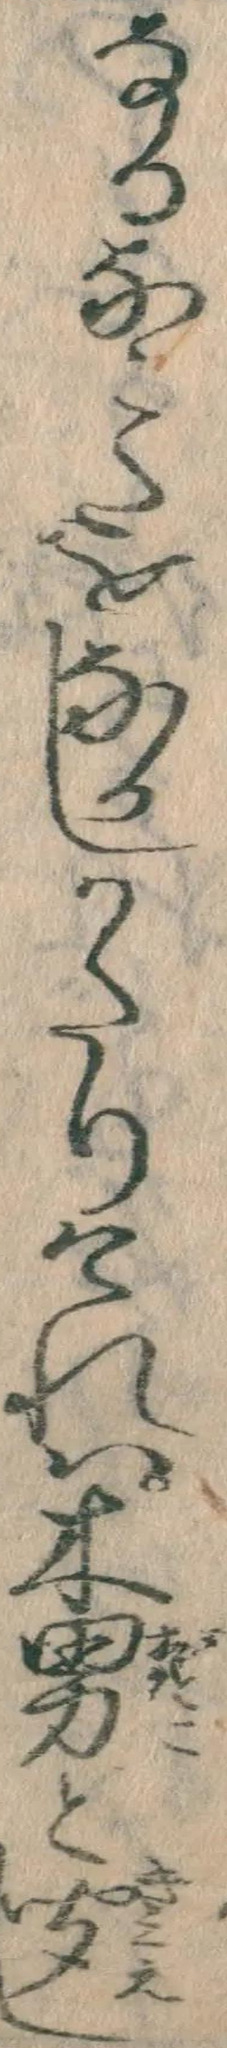なるなたをなかしかたりけれは。木男と聞し
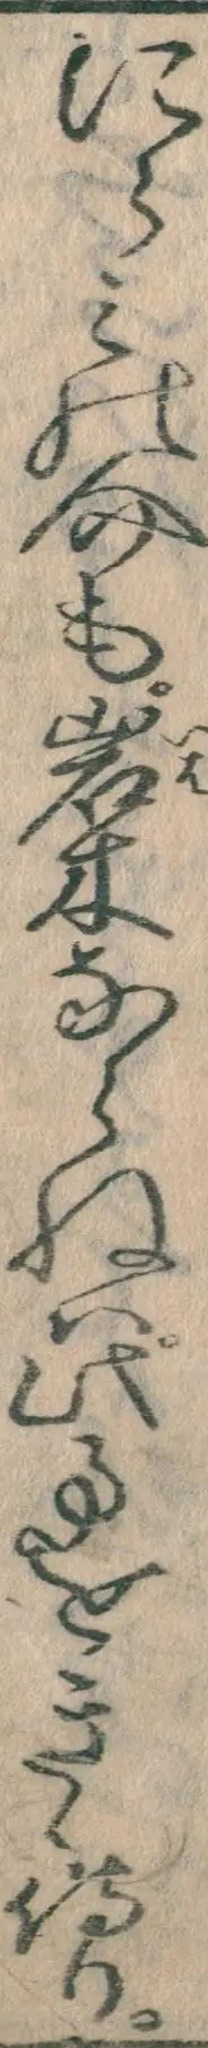にらみの介も。岩木ならねは。此事をきゝ侍り。
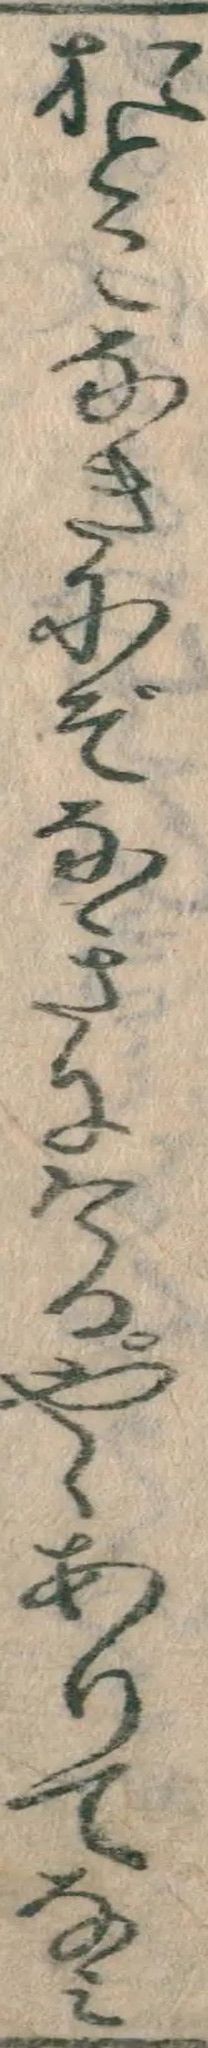おとこなきにぞなきにける。やゝありてなみ
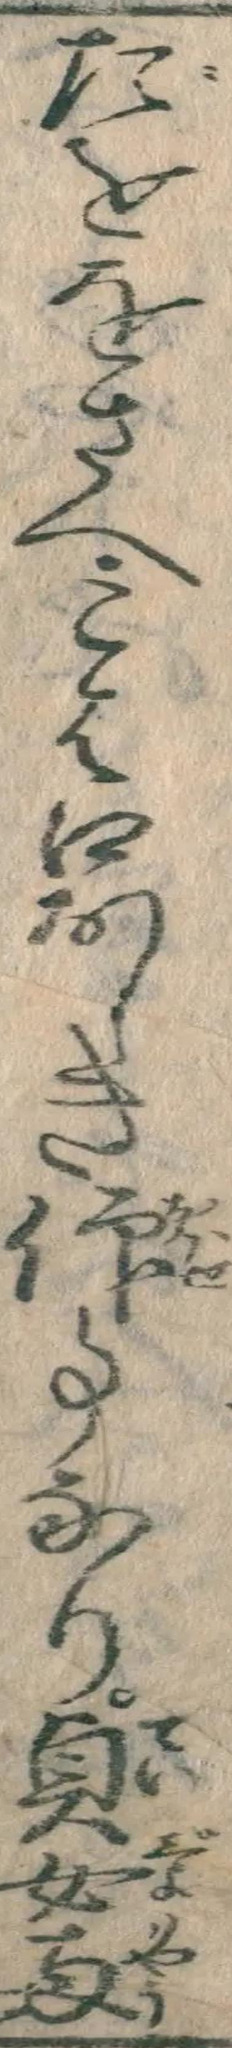だををさへ、こは口おしき仰事なり。貞女両
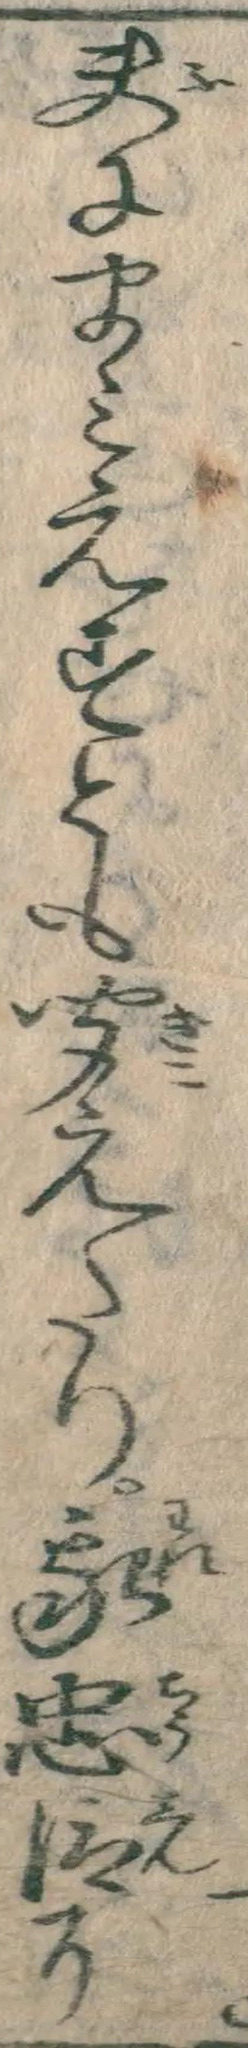夫にまみえすとも聞えたり。我忠臣に
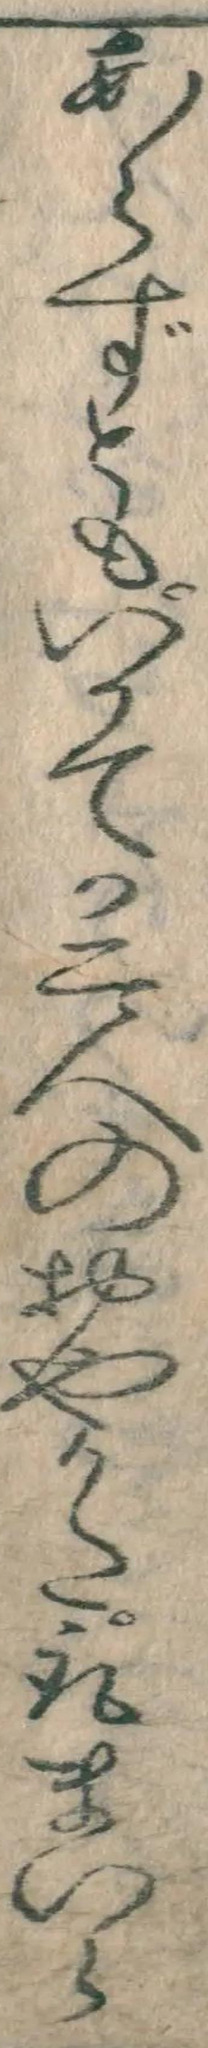あらずとも。いかてか二人のおやかた。取まいら
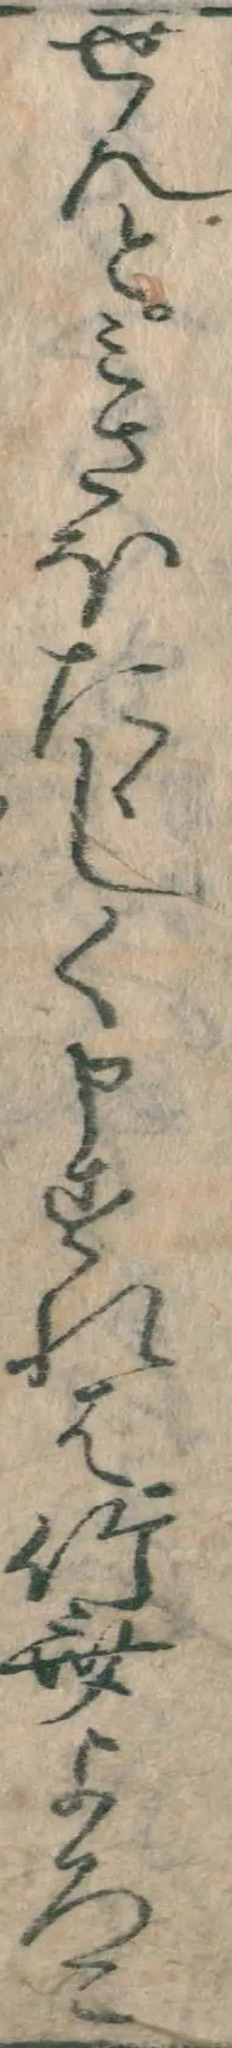せんと。みさほたゝしく申すれは、竹斎よろこ
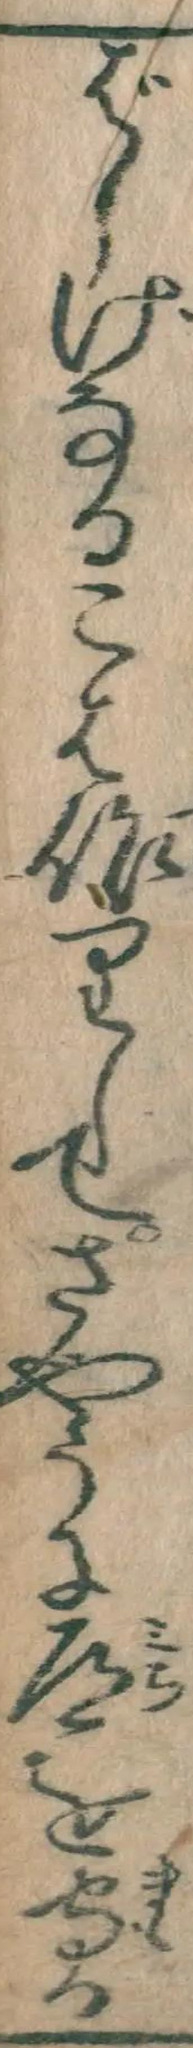ばしげなるこは作りして。さやうに道を守る

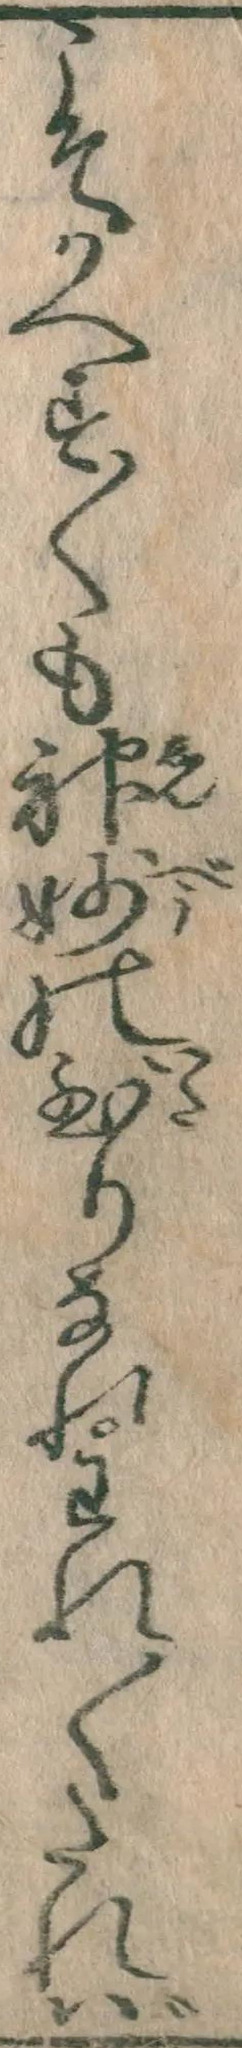こそかへす〳〵も神妙の至りなれ。われ〳〵たれば
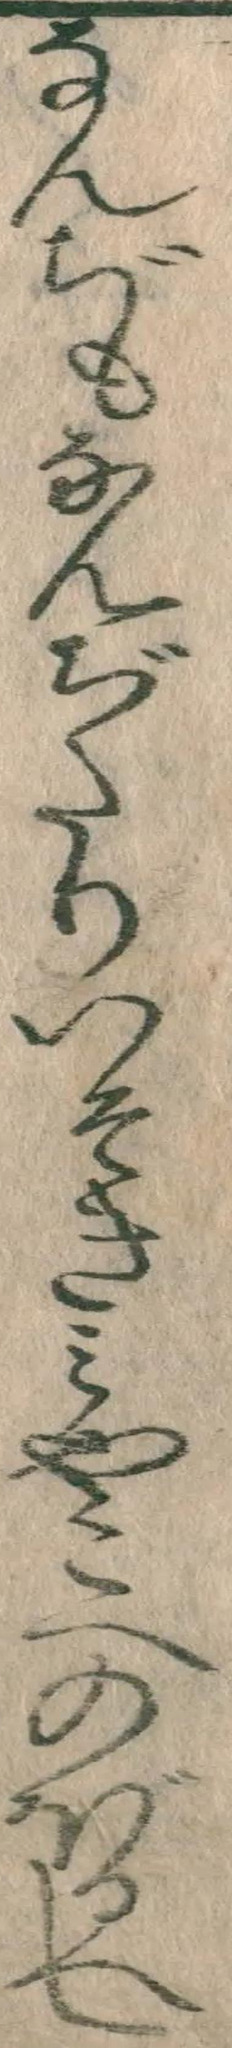なんぢもなんぢたりいそきみやこへのぼるへし
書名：竹斎狂歌物語 3巻
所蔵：国立国会図書館 National Diet Library, JAPAN
